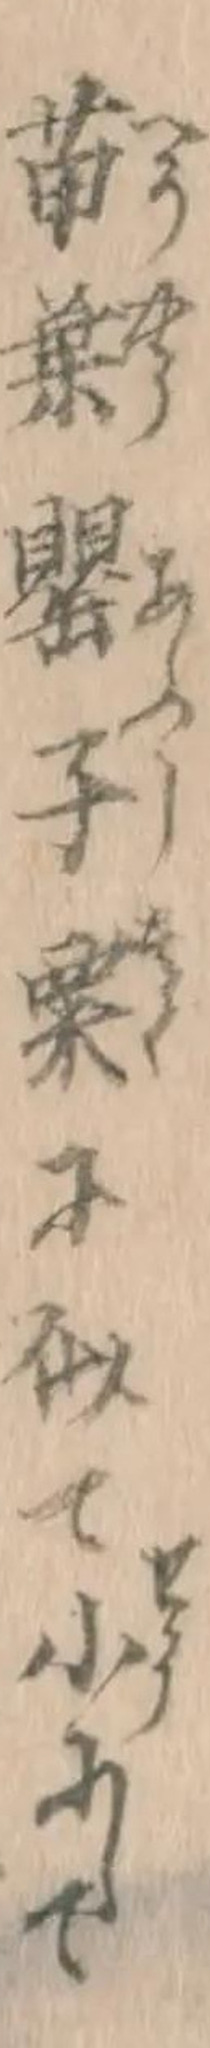苗葉罌子粟に似て小にして
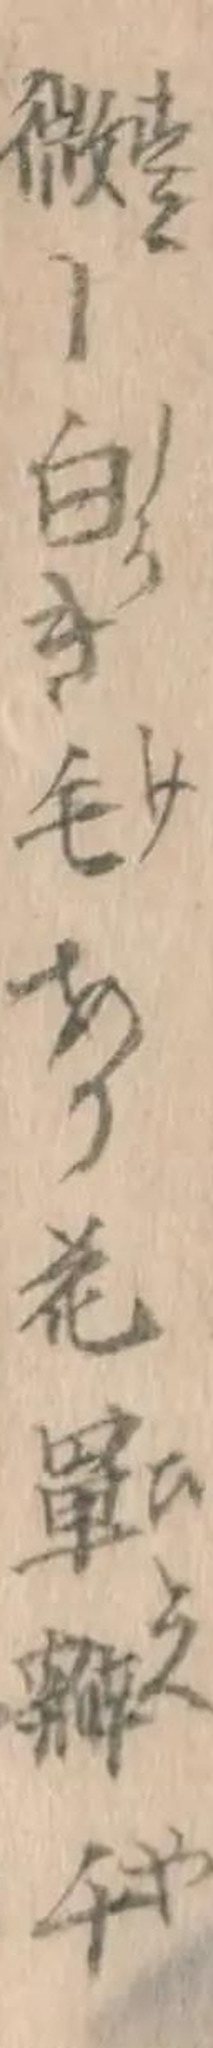微し白き毛あり花単弁千
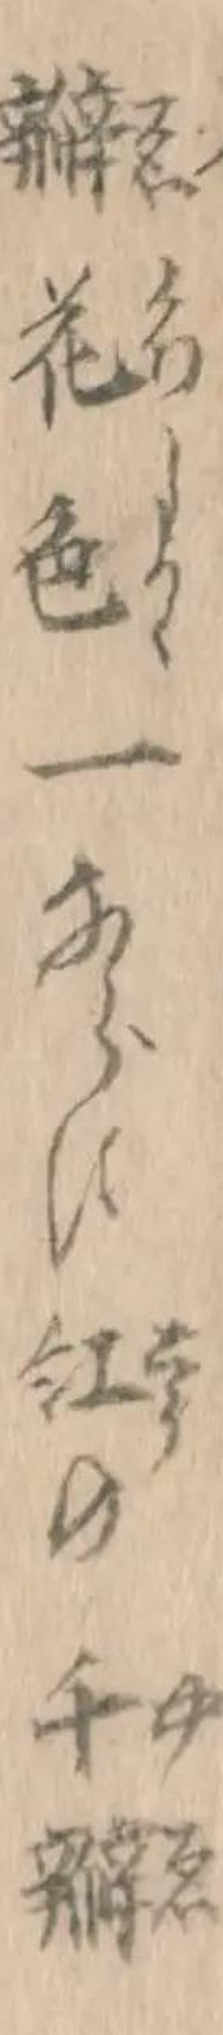弁花色一ならす紅の千弁
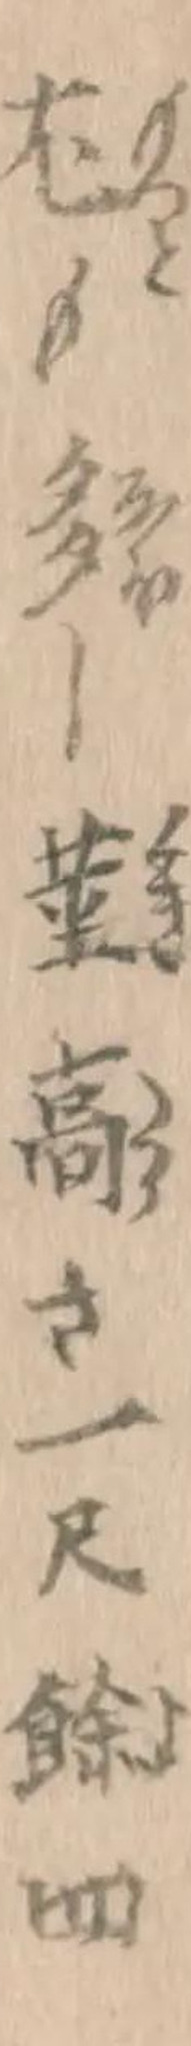尤も多し茎高さ一尺余四
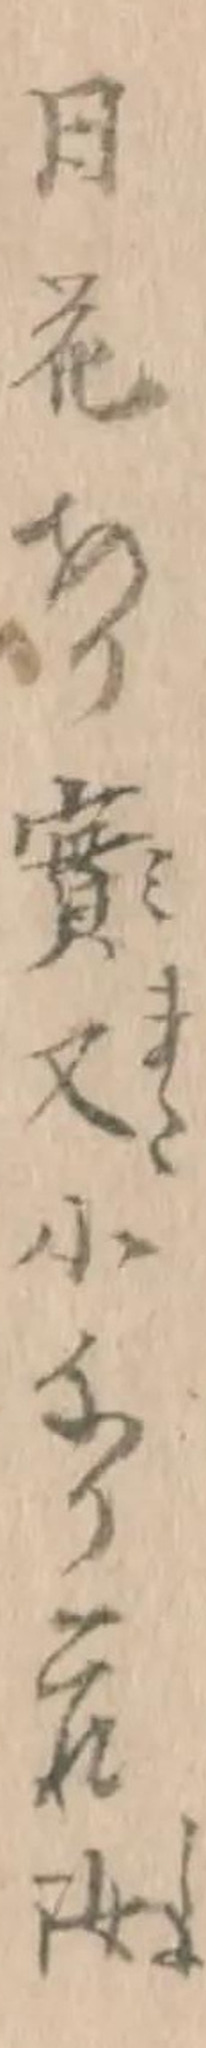月花あり実又小なりこれ汝
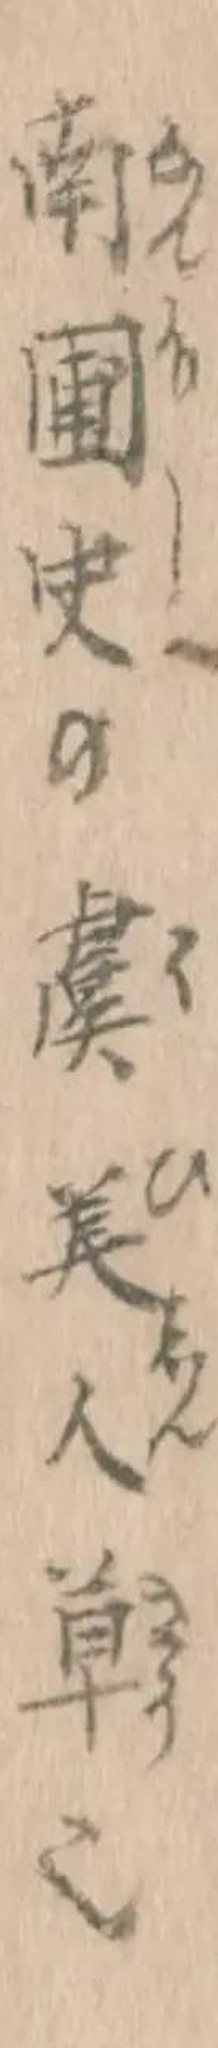南圃史の虞美人草也

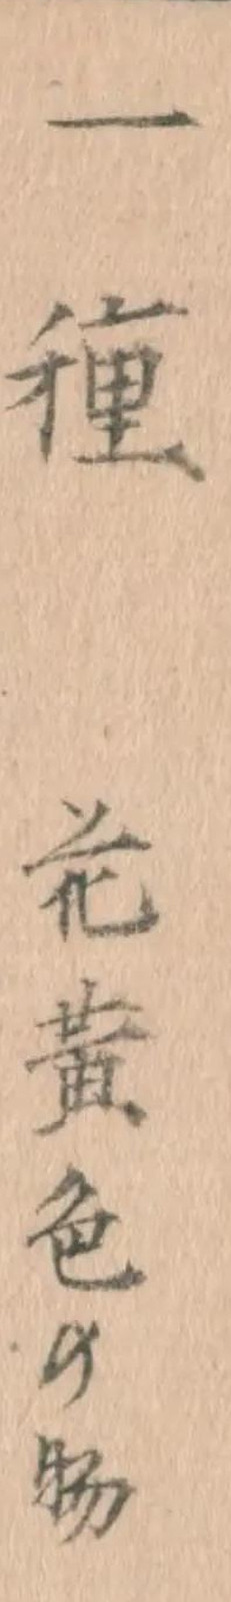一種花黄色の物
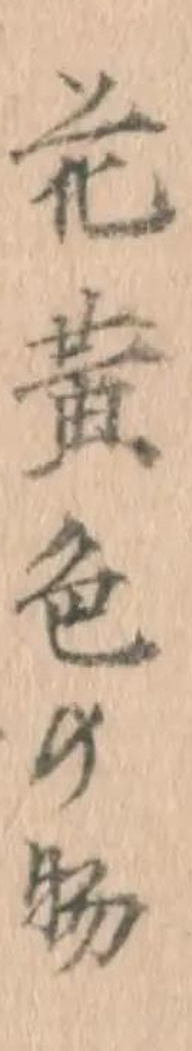花紅色の物
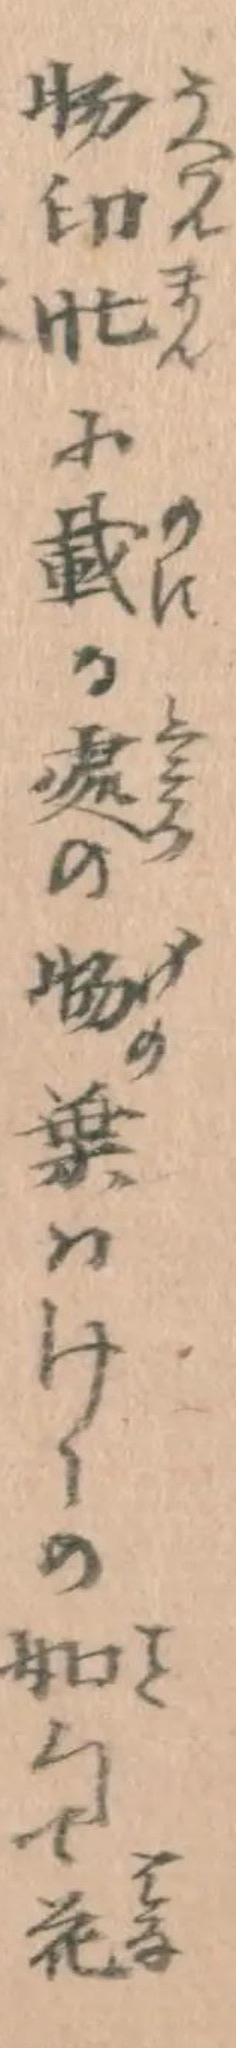物印忙に載る処の物葉はけしの如くして花
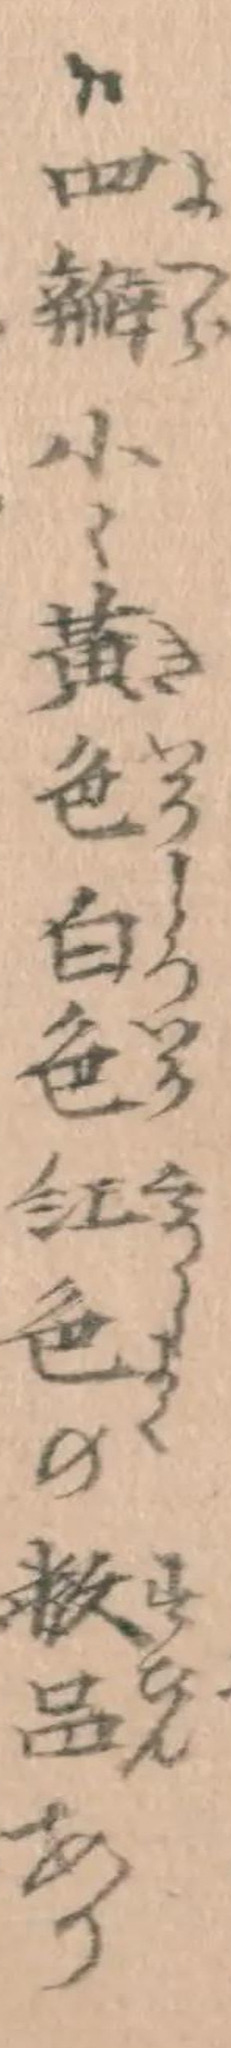は四弁小く黄色白色紅色の数品あり
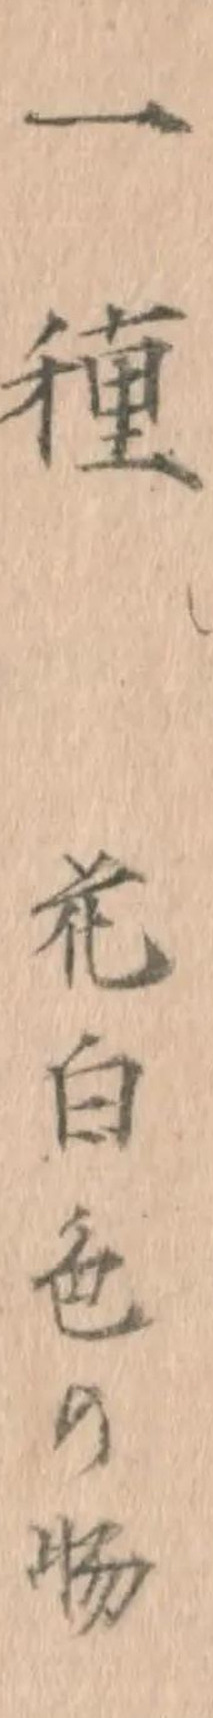一種花白色の物
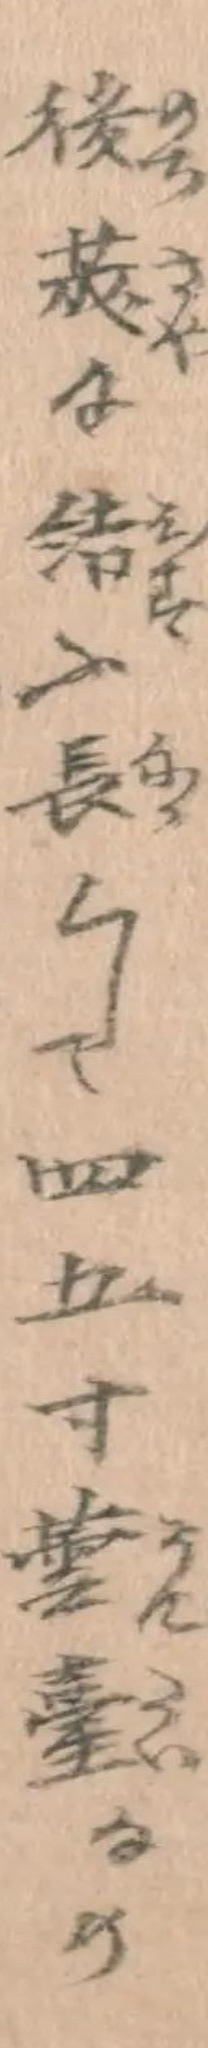後莢を結ふ長くして四五寸蕓台なの
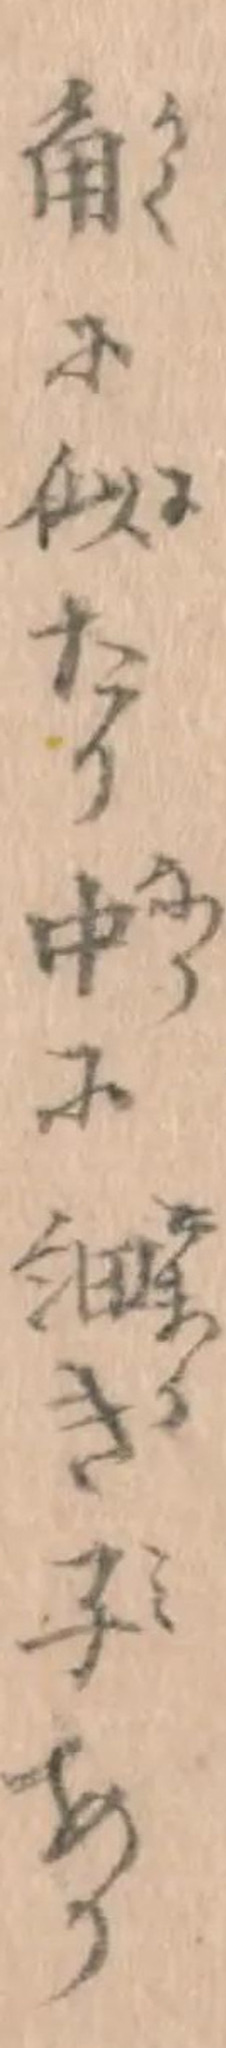角に似たり中に細き子あり
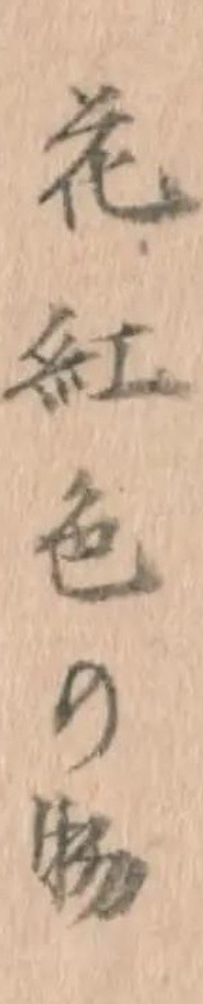花紅色の物
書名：本草図譜. 巻40-42
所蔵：国立国会図書館 National Diet Library, JAPAN
